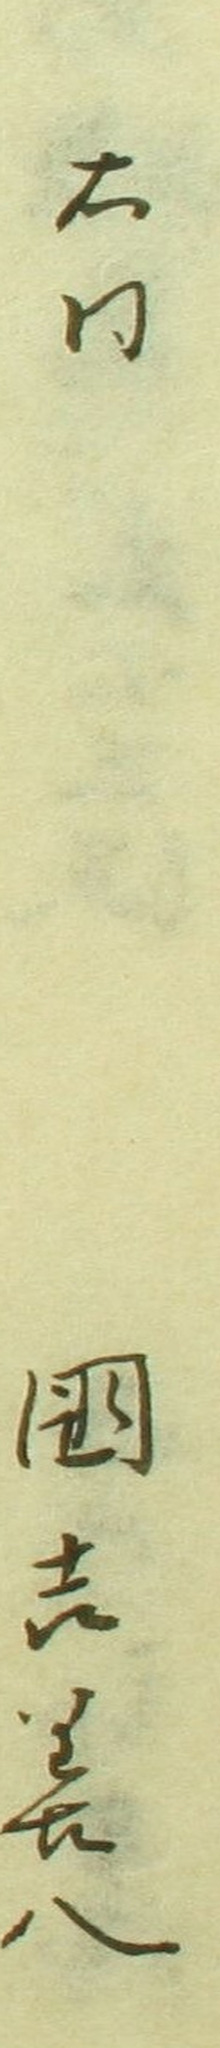右同国吉善八
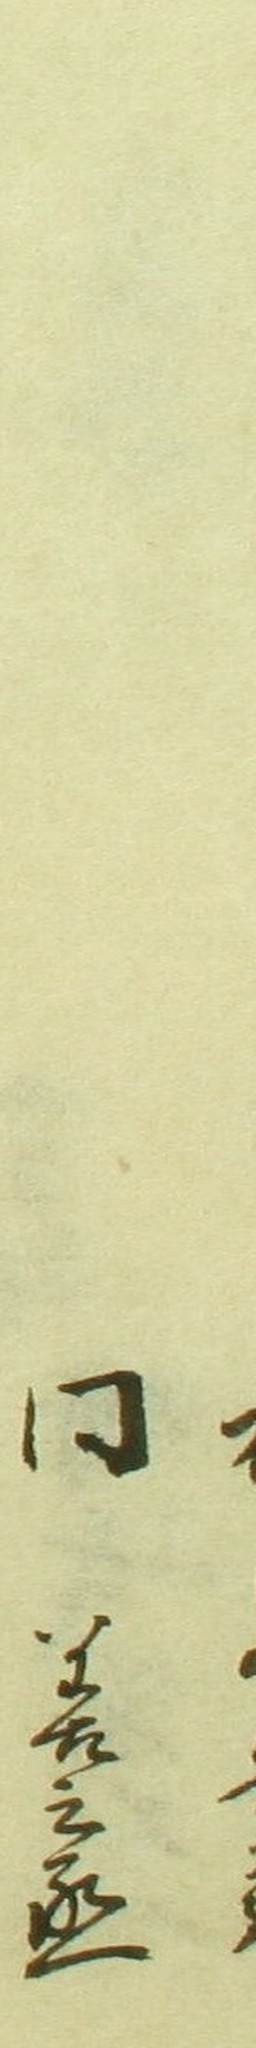同善之亟
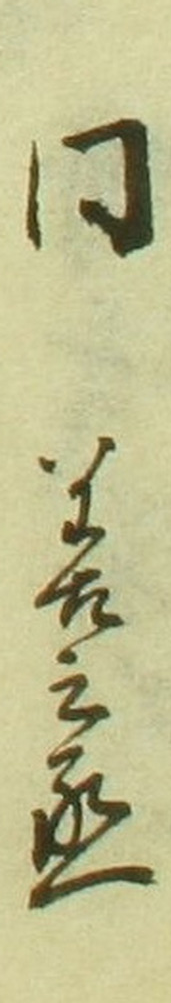同善之亟
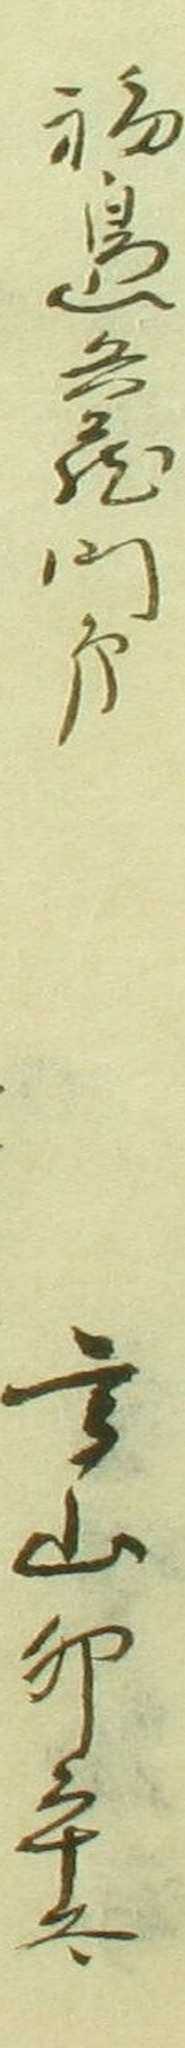福島兵蔵門弟高山卯平太
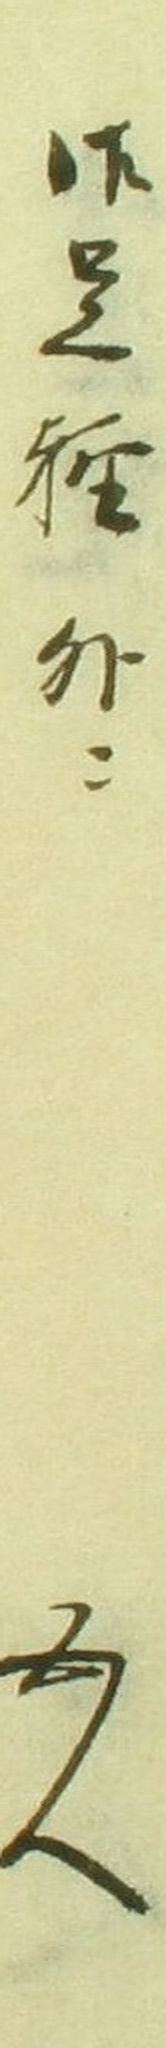御足軽外ニ五人
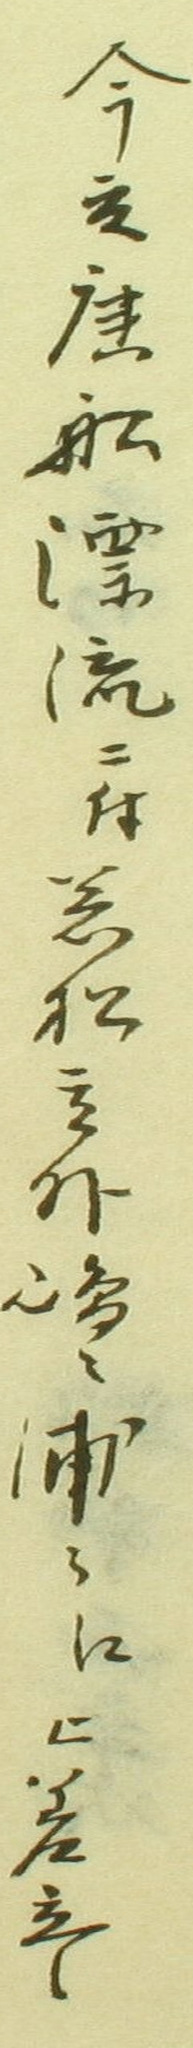今度唐船漂流ニ付若松其外島々浦々江被差立候
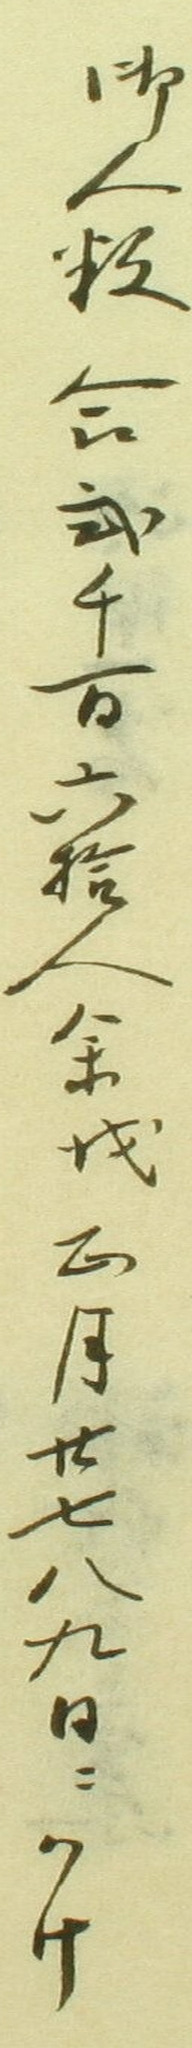御人数合弐千百六拾人余戌正月廿七八九日ニかけ
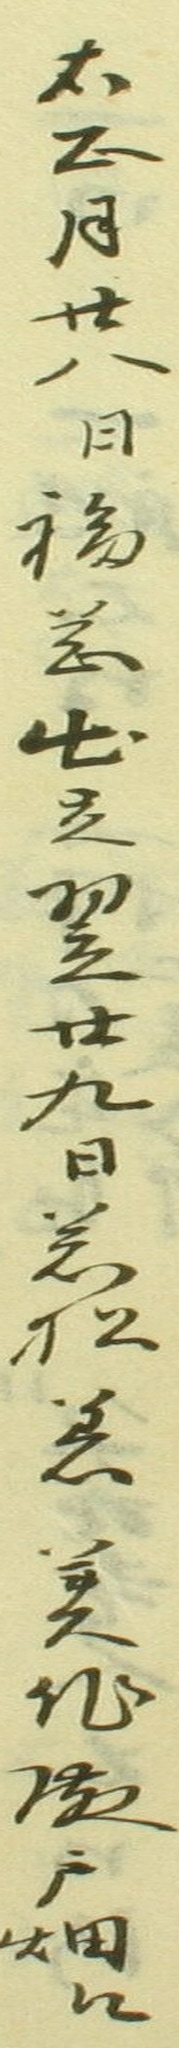右正月廿八日福岡出立翌廿九日若松着美作殿戸畑江
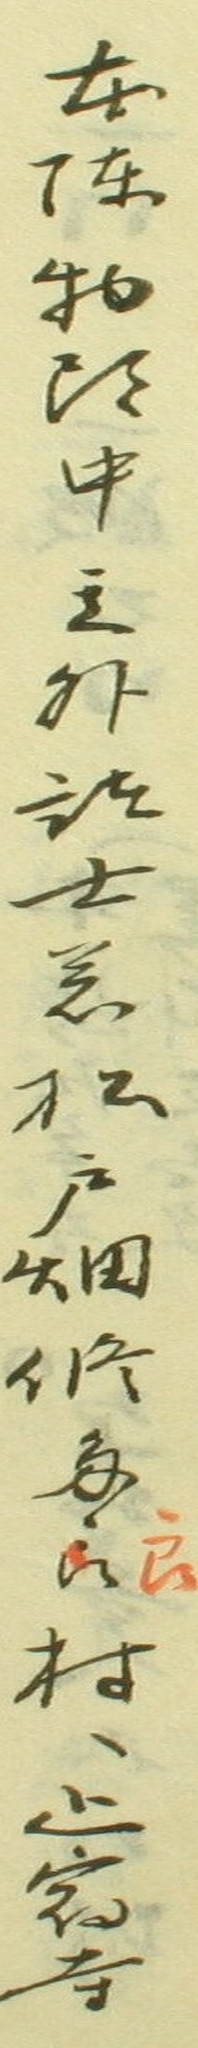本陣物頭中其外諸士若松戸畑修多良村へ止宿寺
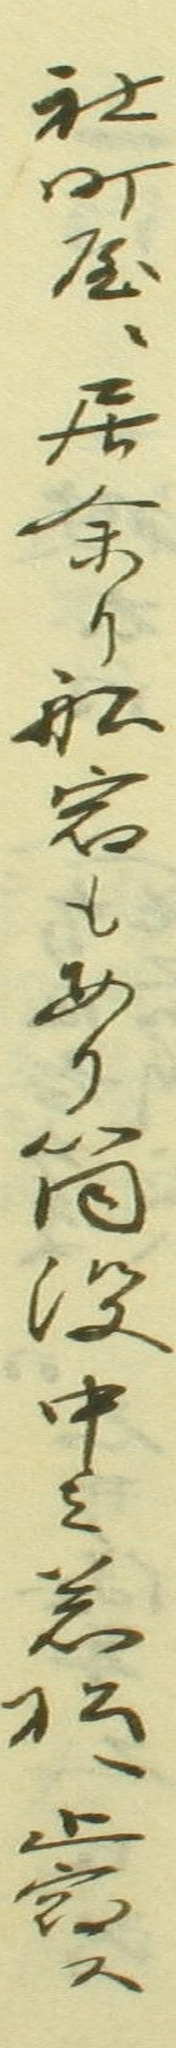社町屋へ居余り船宿もあり筒役中は若松へ止宿ス
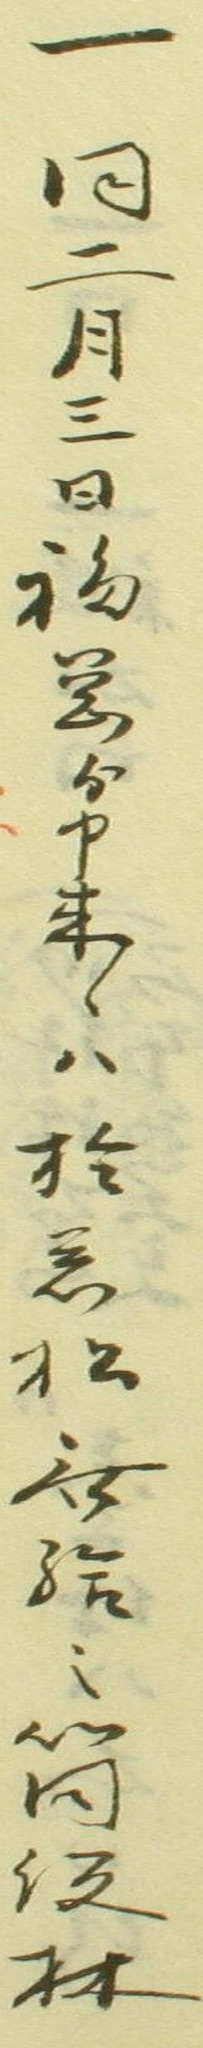一同二月三日福岡ゟ申来候は於若松無給之筒役林
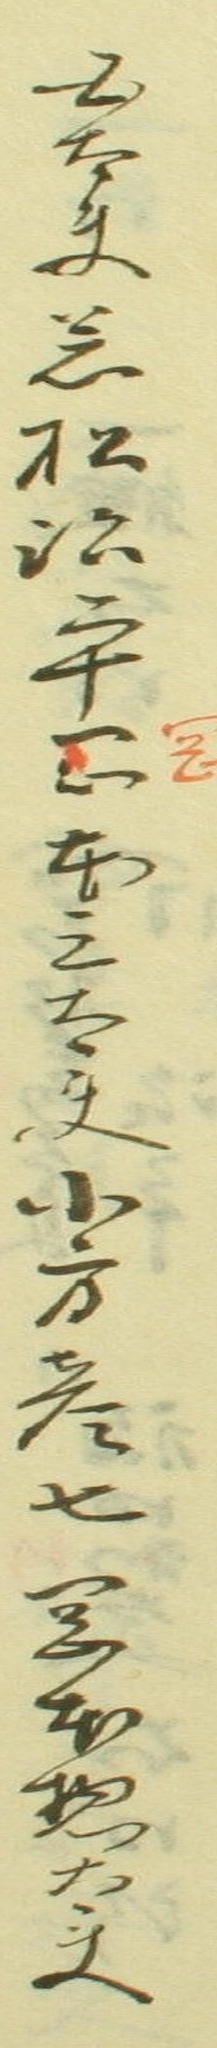五太夫若松治平岡本三太夫小方彦七岡本惣太夫
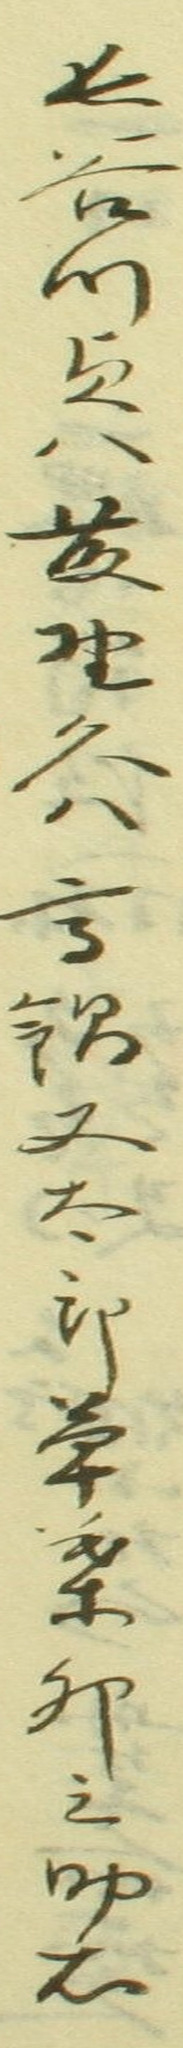長谷川貞八藤野久八高鍋又太郎草葉夘之助右
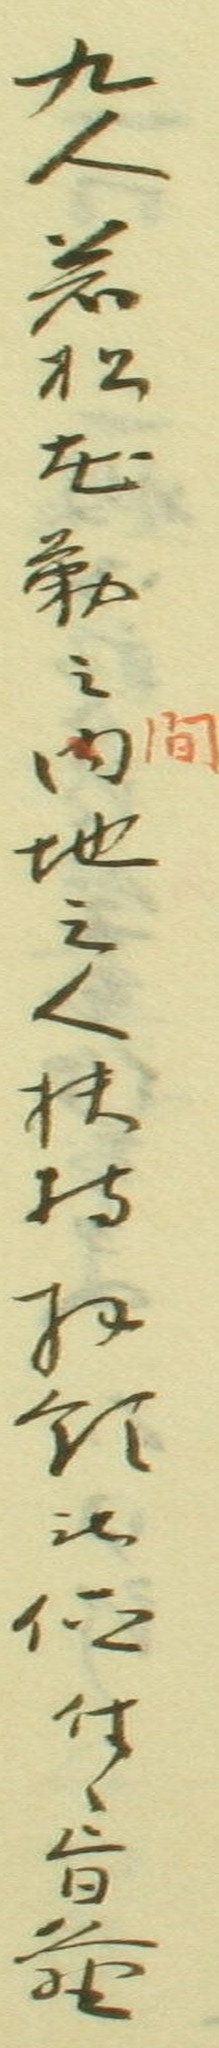九人若松在勤之間地三人扶持拝領被仰付候旨久野
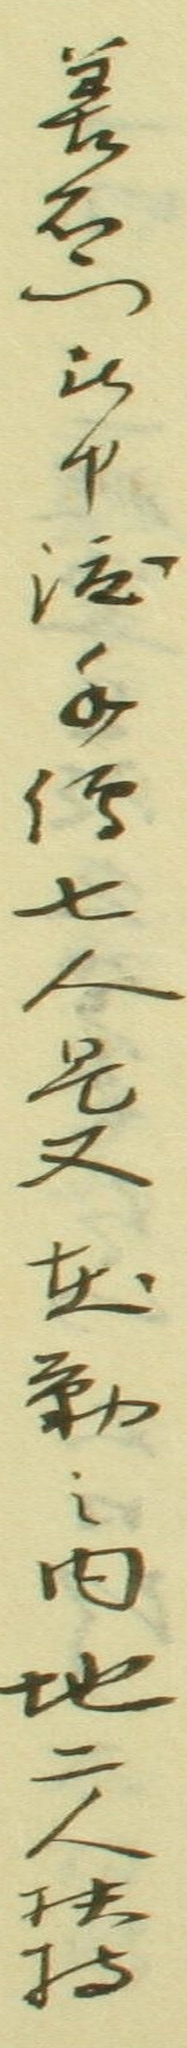善右衛門被申渡手伝七人是又在勤之内地二人扶持
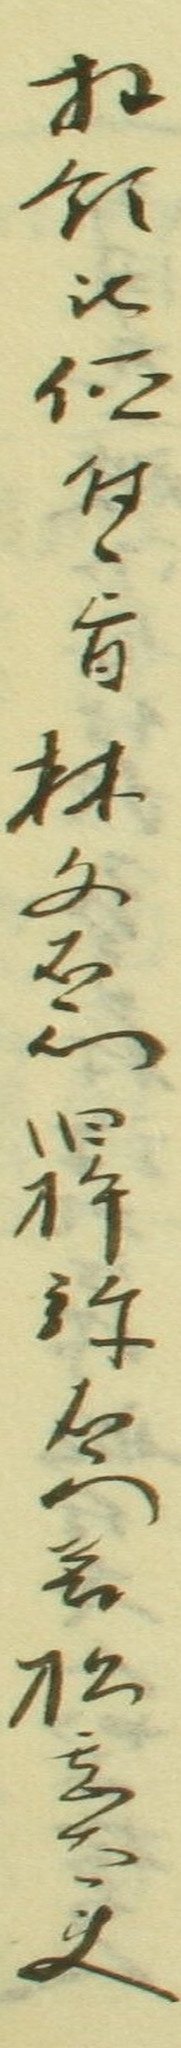拝領被仰付候旨林文右衛門臼杵弥右衛門若松甚太夫
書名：唐船漂流記 二
